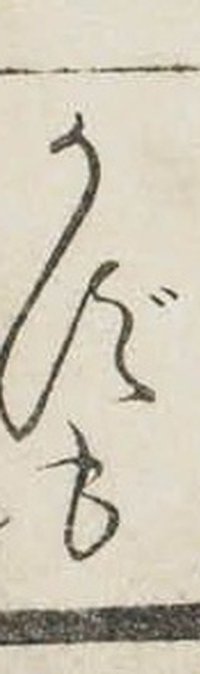かずも

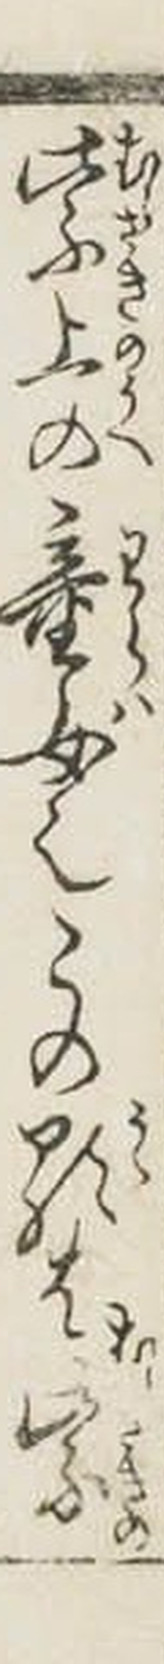紫上の童女也この歌は紫
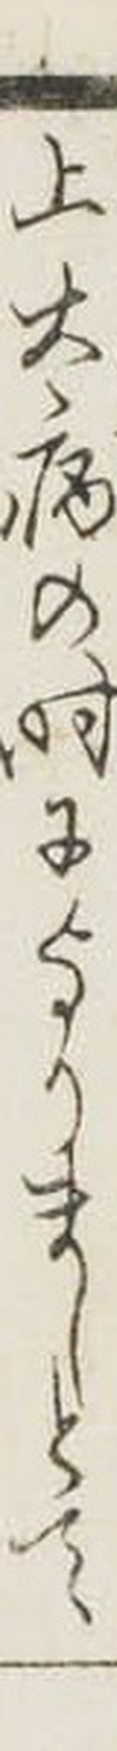上大病の時によりましとて
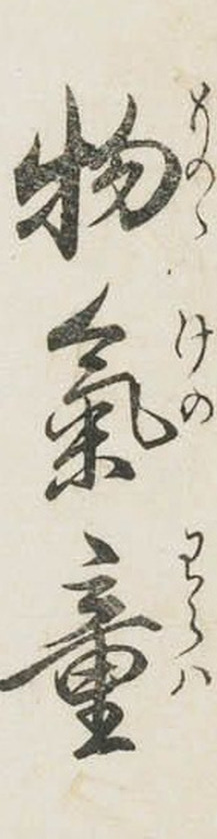物気童
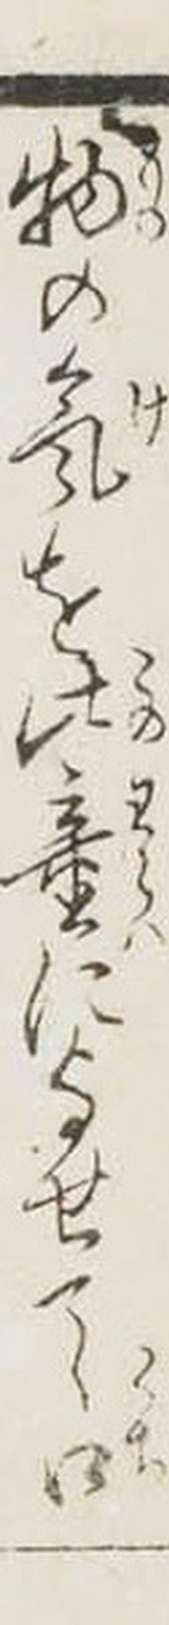物の気を此童によせて口
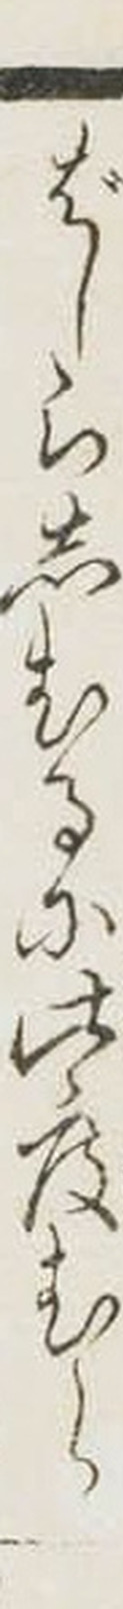ばしらしむるに此度むら
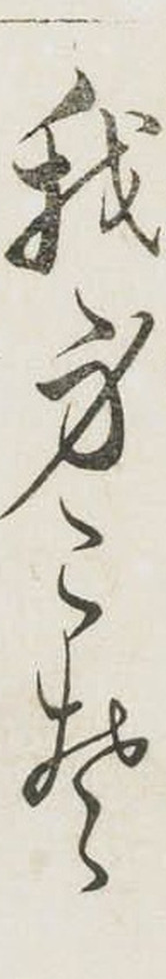我身こそ
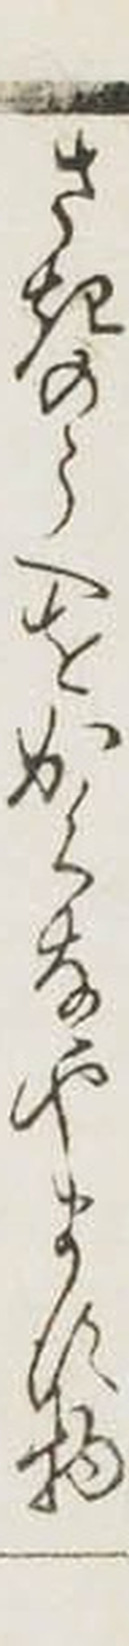さきのうへをかくなやます物
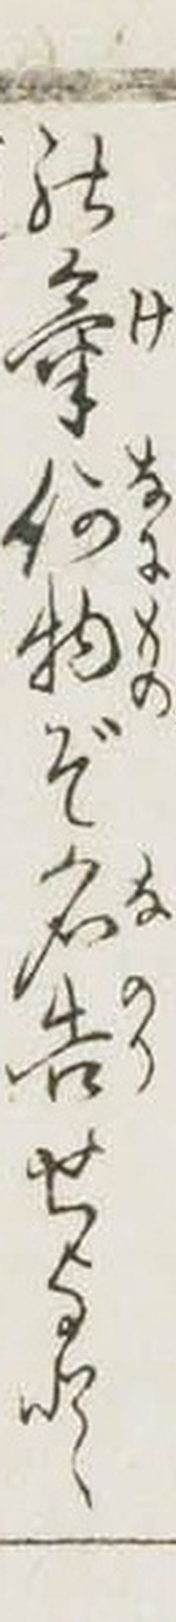の気何物ぞ名告せよと
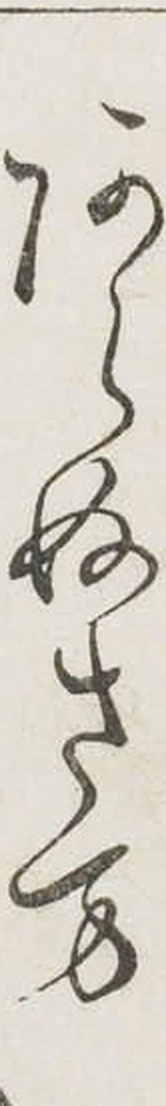あらぬさま
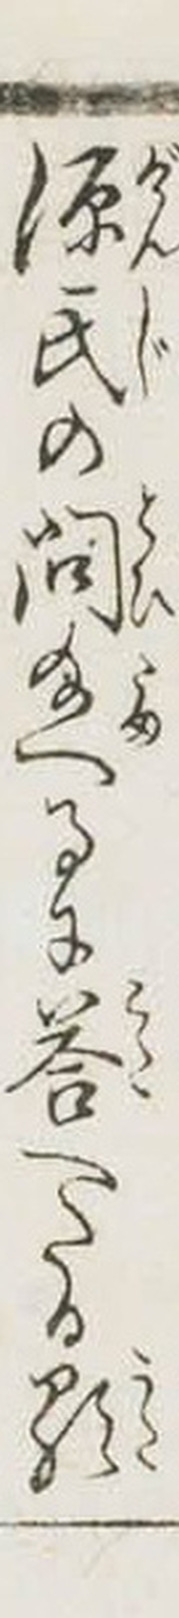源氏の問給へるに答へたる歌
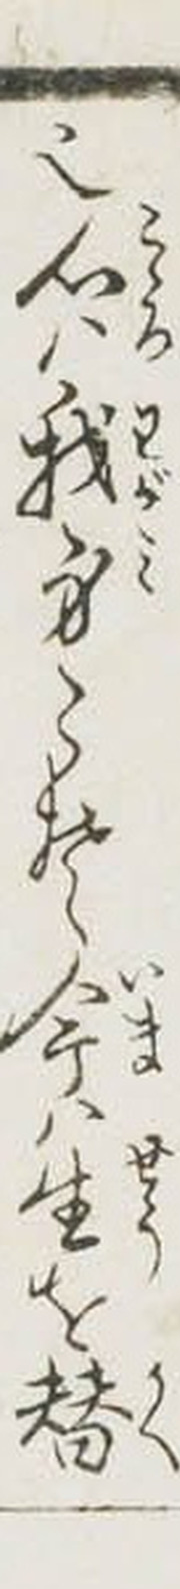也心は我身こそ今は生を替
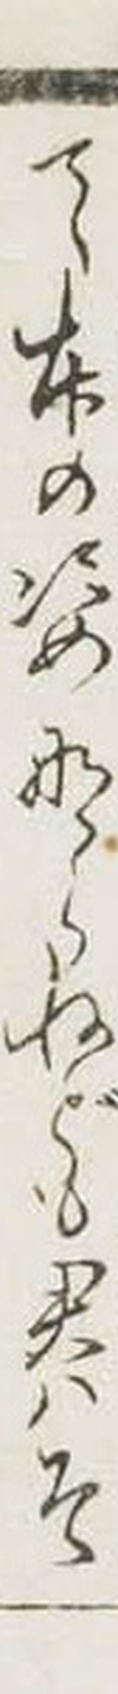て本の姿ならねども君はそ
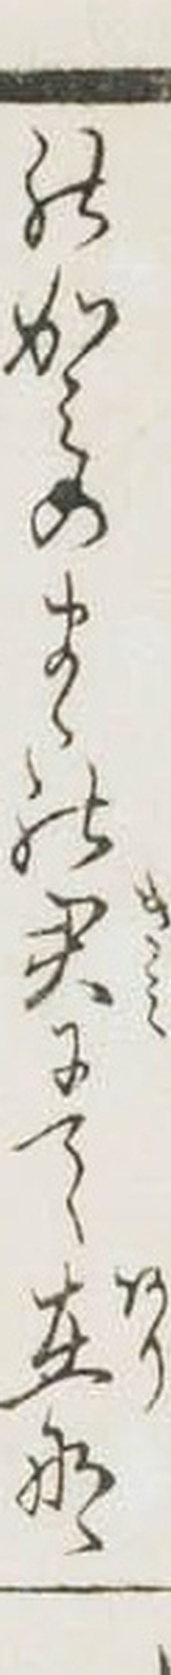のかみのまゝの君にて在な
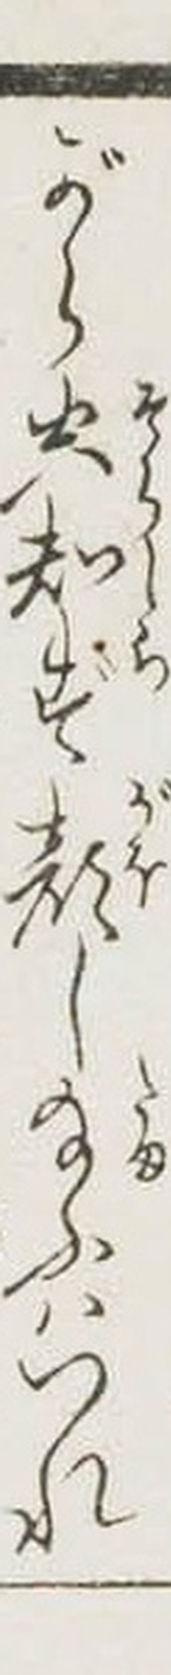がら空知ず顔し給ふはつれ
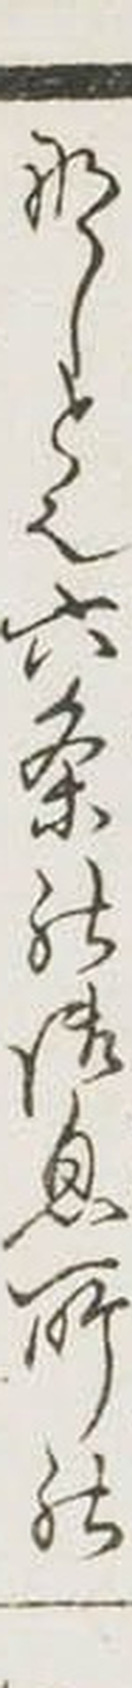なしと也六条の御息所の
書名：源氏百人一首
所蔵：東京学芸大学教育コンテンツアーカイブ
